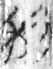利（利）
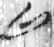㠯（以）
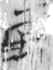取（娶）
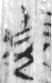妻
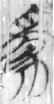○（嫁）
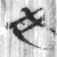女
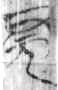○（冠）
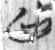㠯
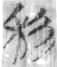利（利）
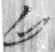㠯（以）
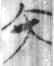內（入）
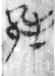邦
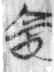{宀𠁩}
